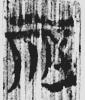禝（稷）
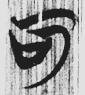可（何）
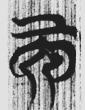而（爾）
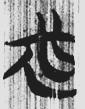必
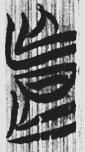良
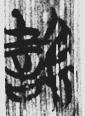○（愼）
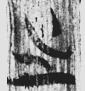之
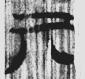亓（其）
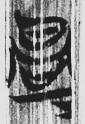明日
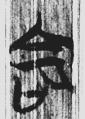命（令）
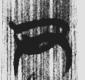尹
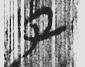子
